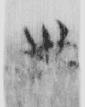{卅一}
